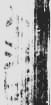箸（書）
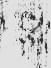所
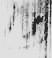㠯（以）
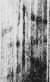內
